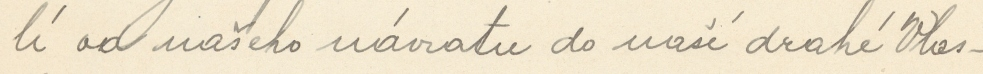lí od našeho návratu do naší drahé Vlas-
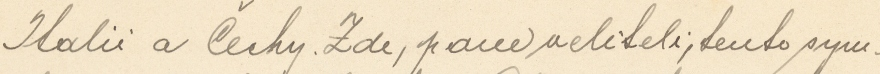Italii a Čechy. Zde, pane veliteli, tento sym-
